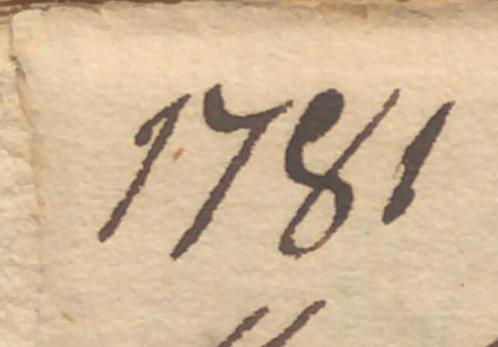1781
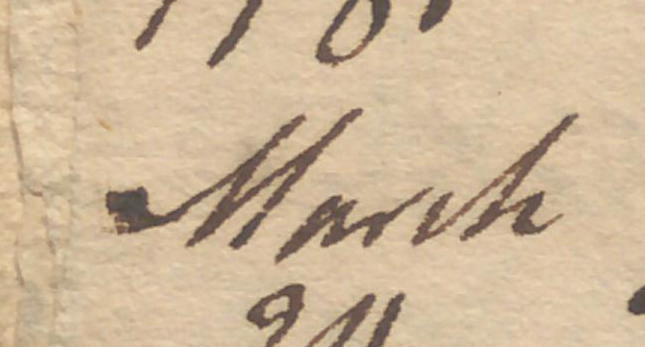March
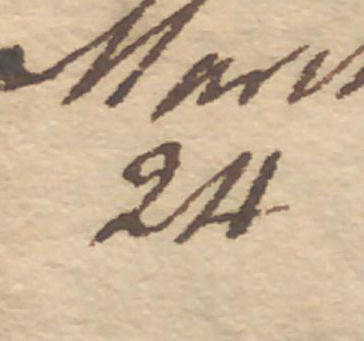24
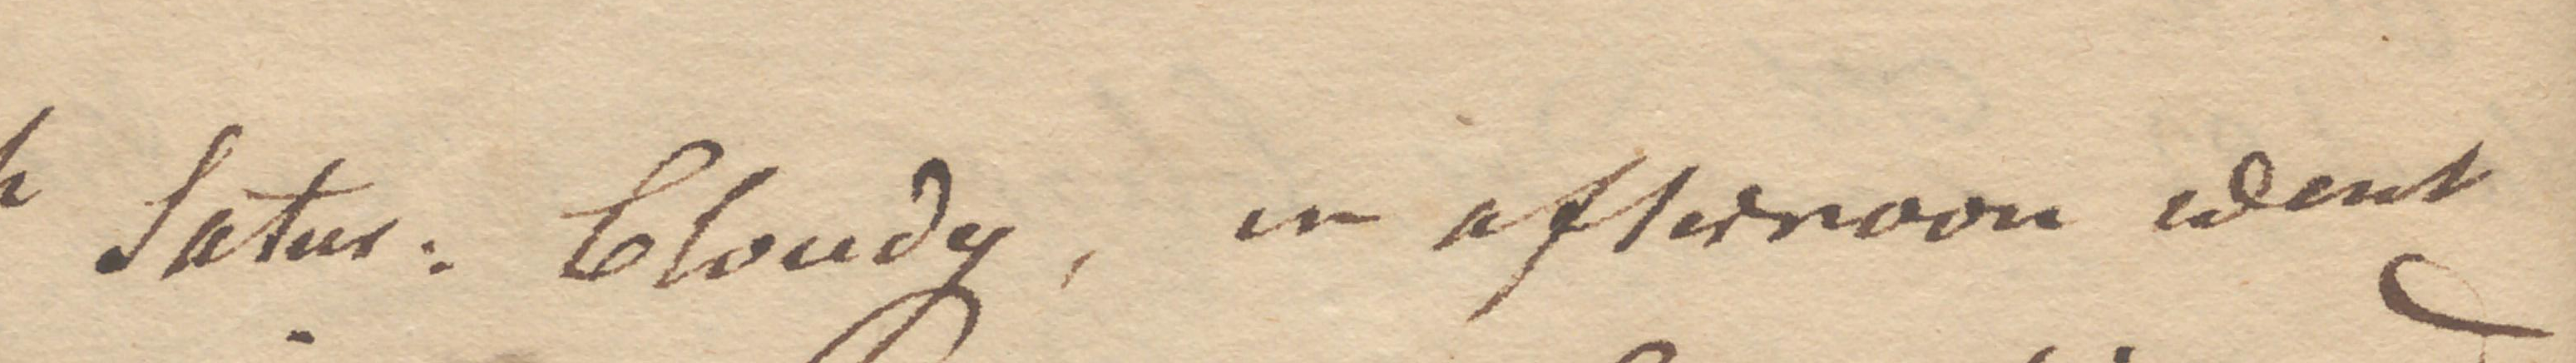Satur: Cloudy, in afternoon went
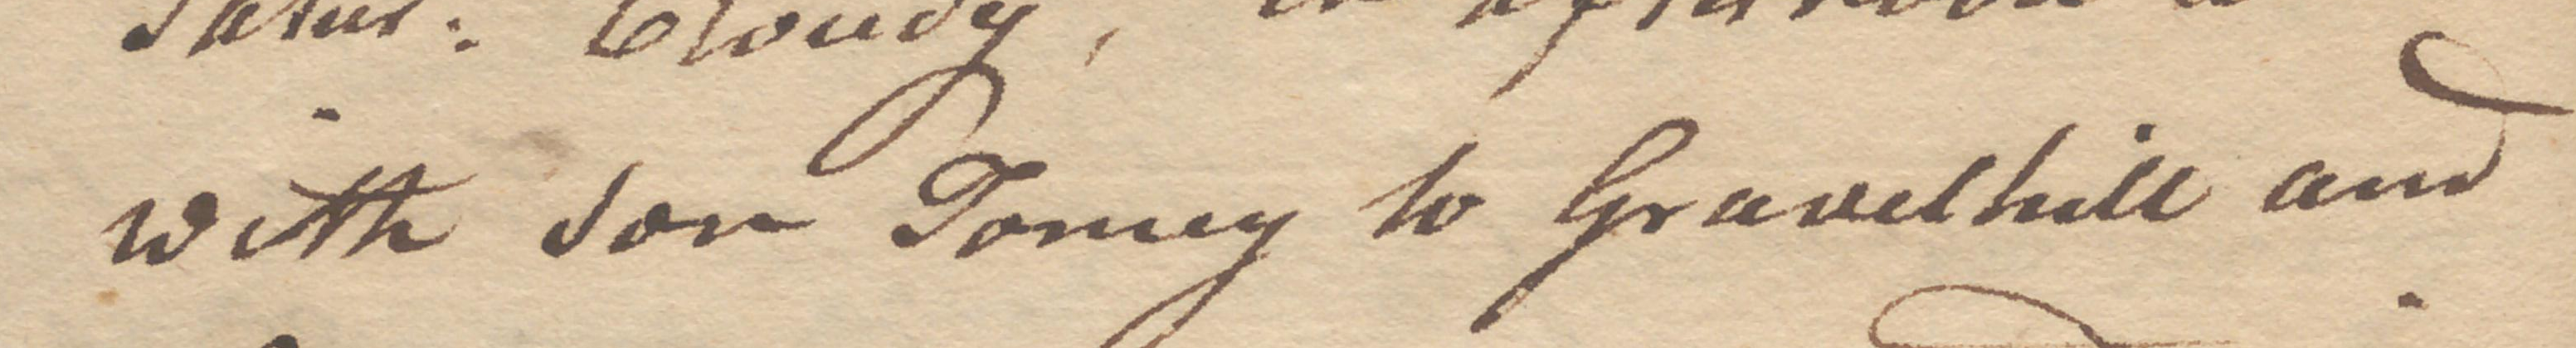with son Tomey to Gravelhill and
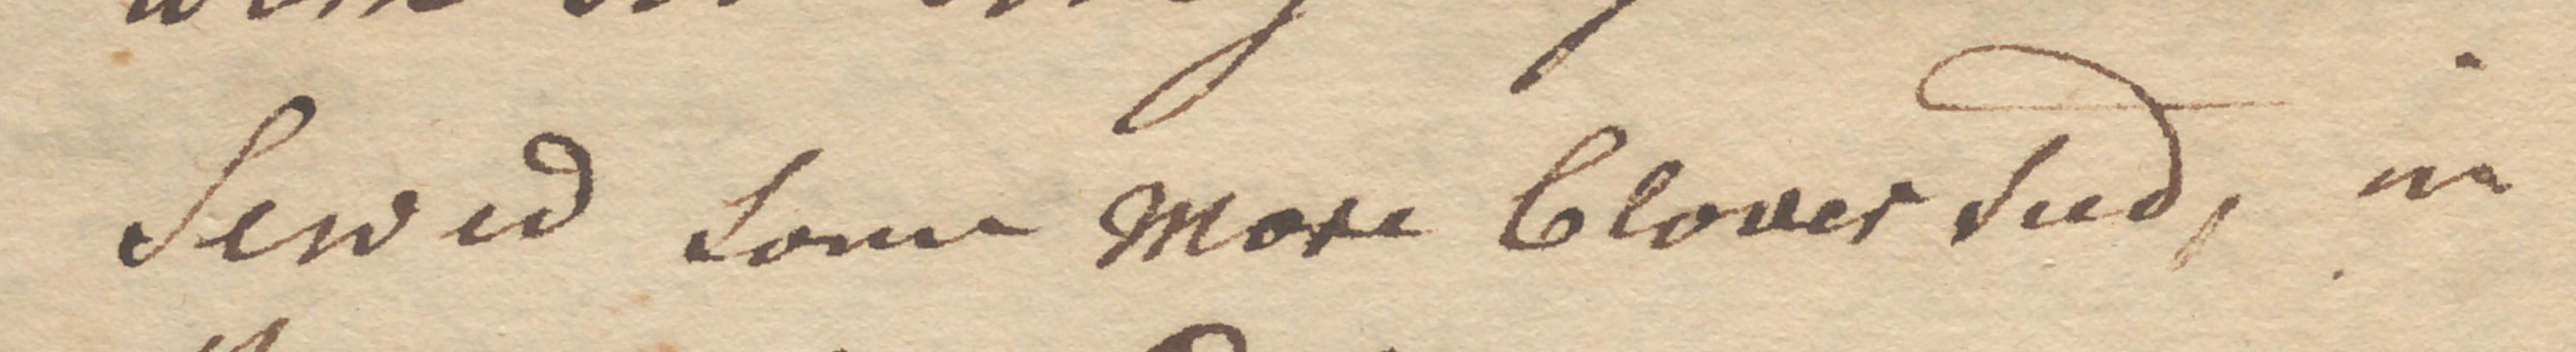sewed some More Clover seed, in
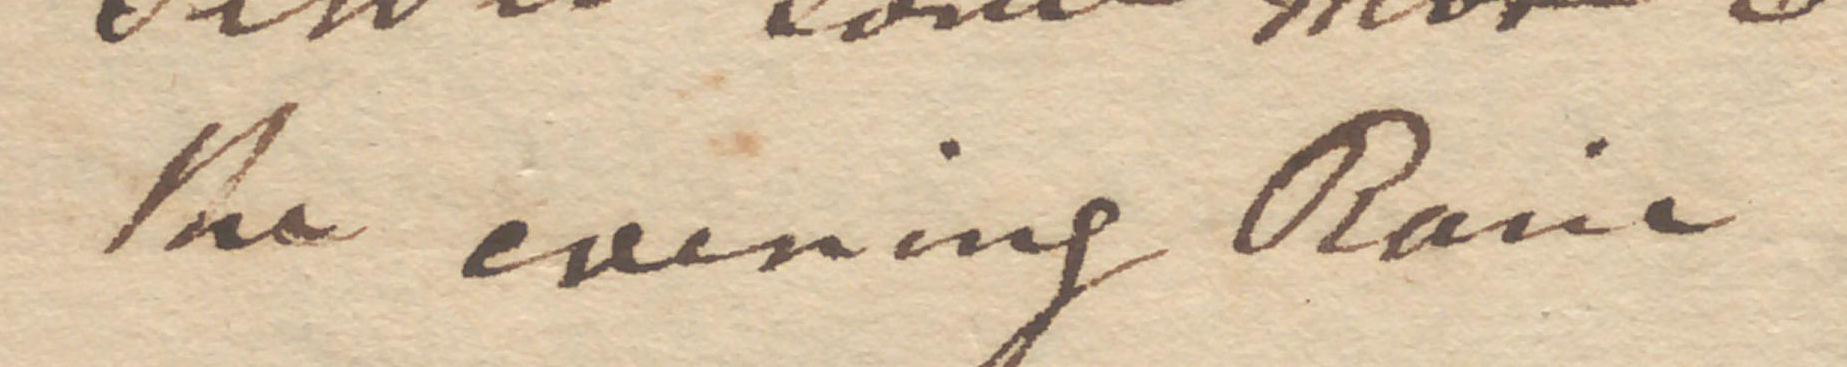the evening Rain
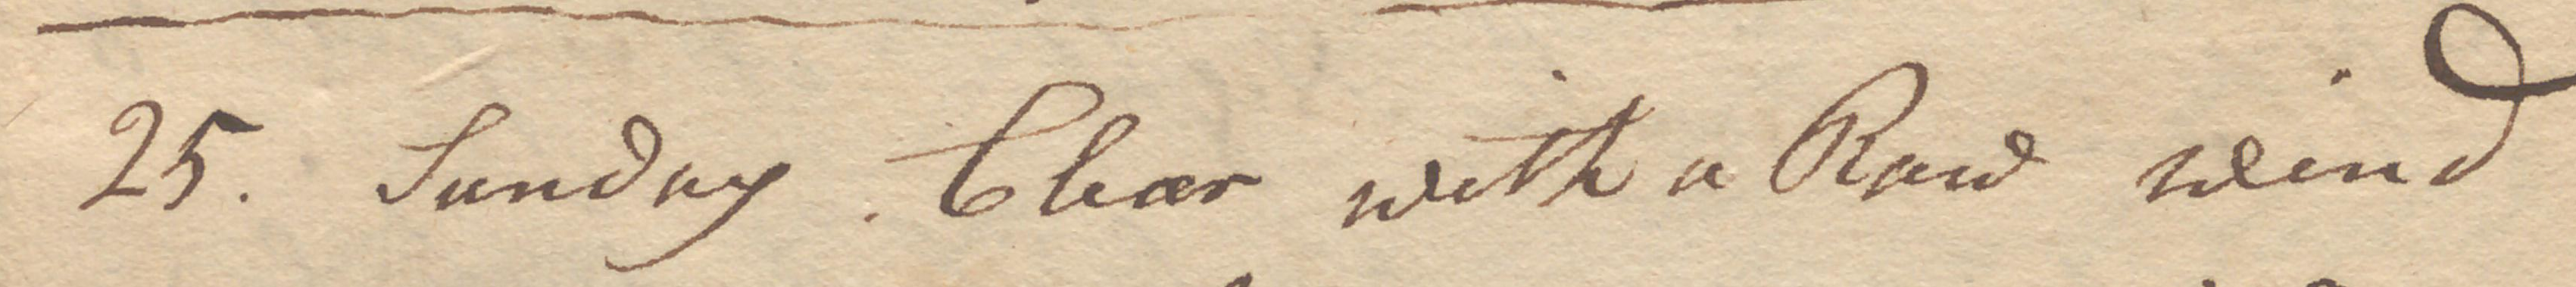25. Sunday Clear with a Raw wind
